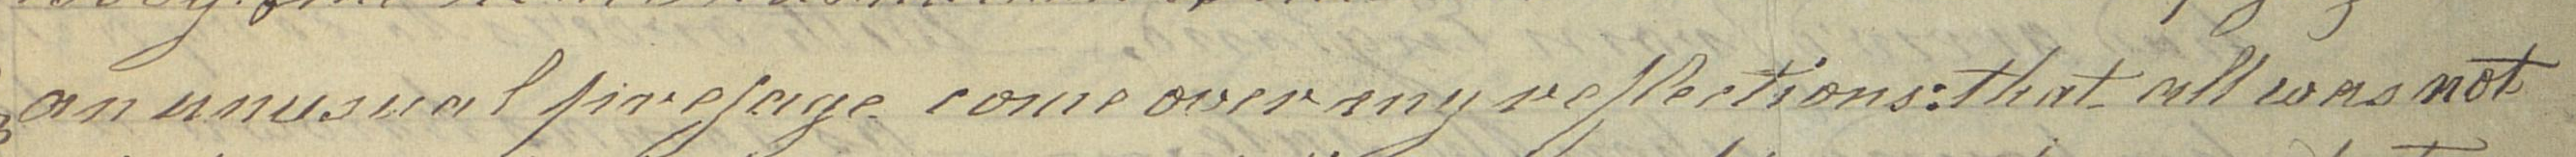an unusual presage come over my reflections: that all was not
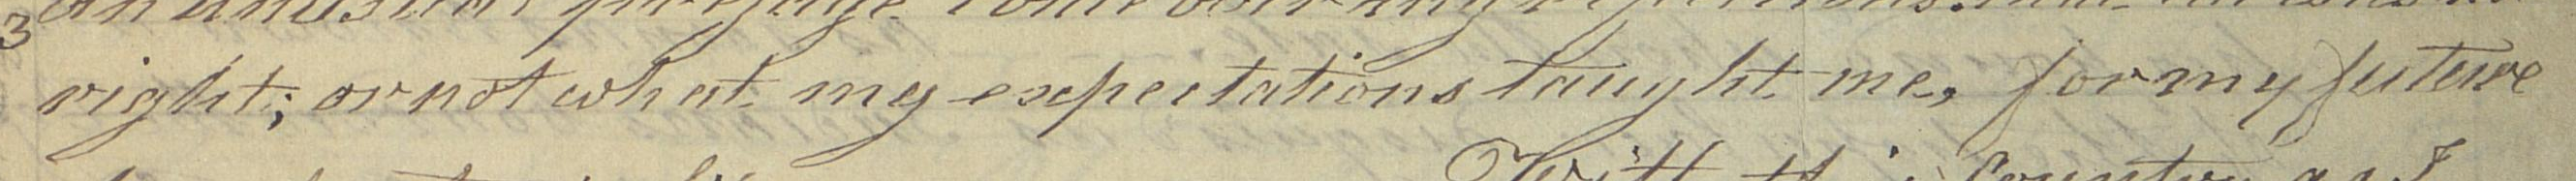right; or not what my expectations taught me for my future
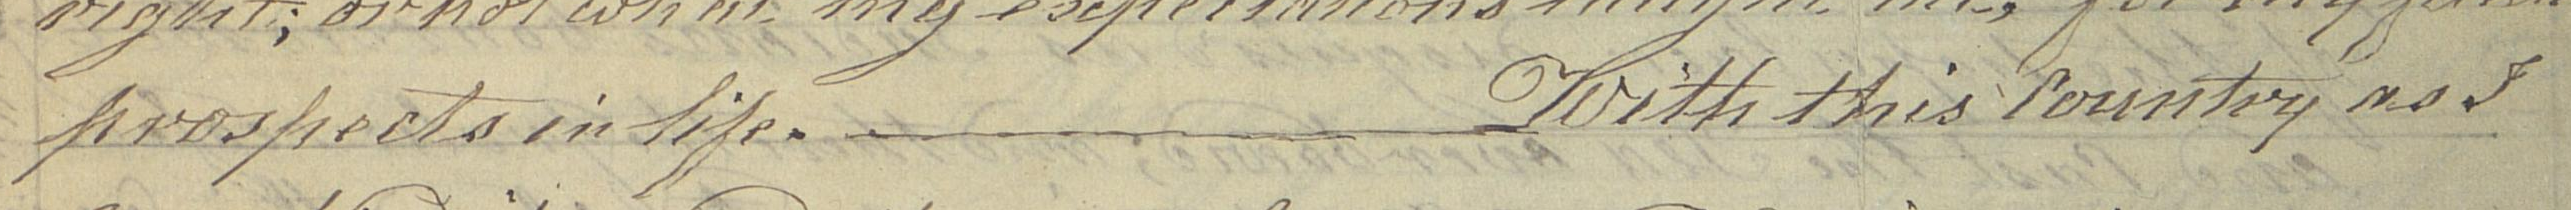prospects in life. With this Country not
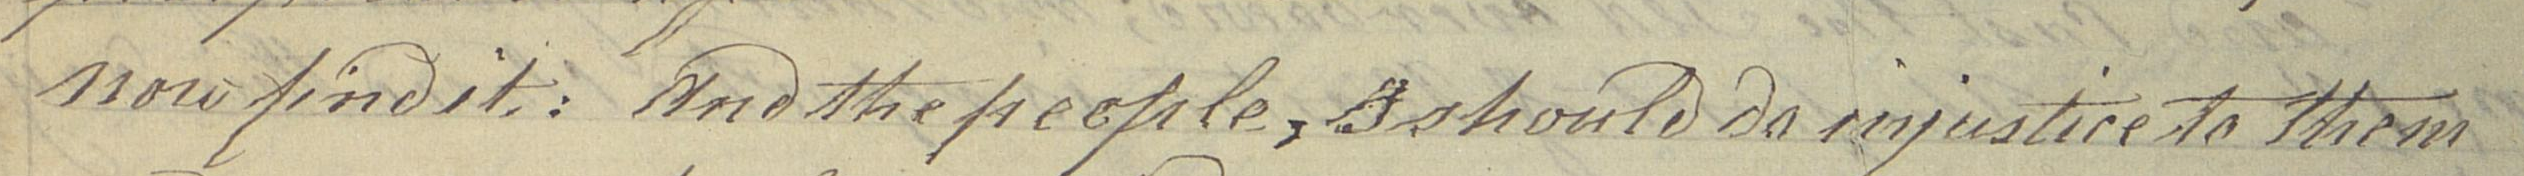now find it: And the people, I should do injustice to them
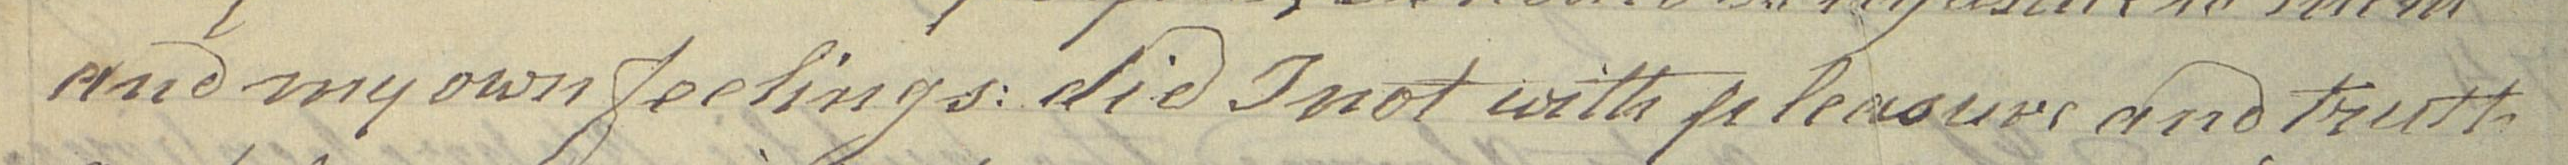and my own feelings did I not with pleasure and truth
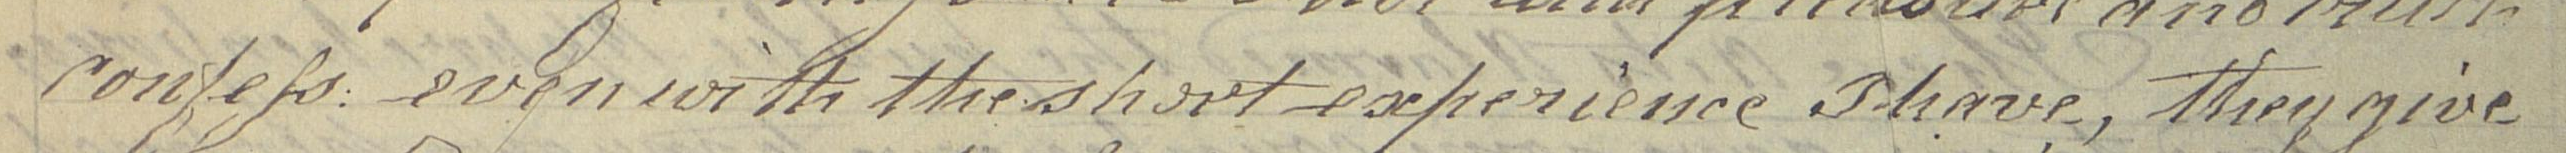confess: even with the short experience I have, they give
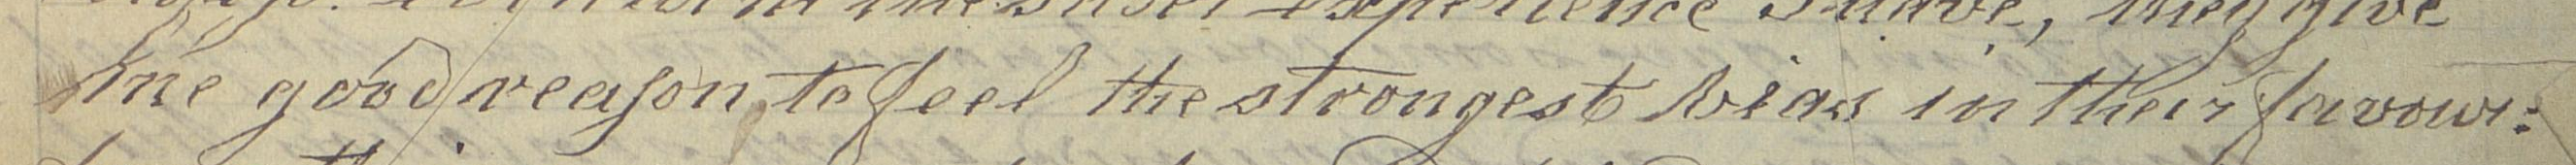are good reason to feel the strongest bias in their favour:
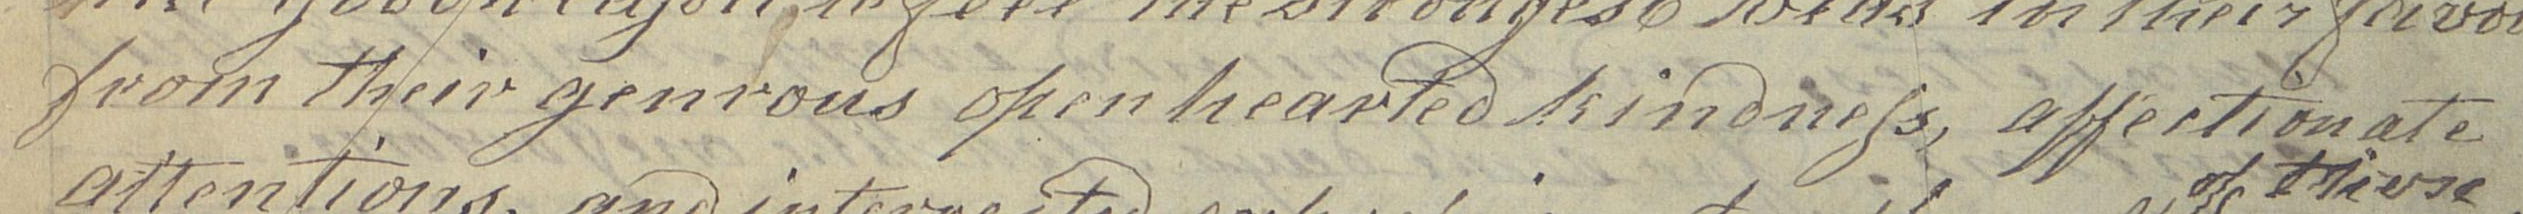from their genrous open hearted kindness, affectionate
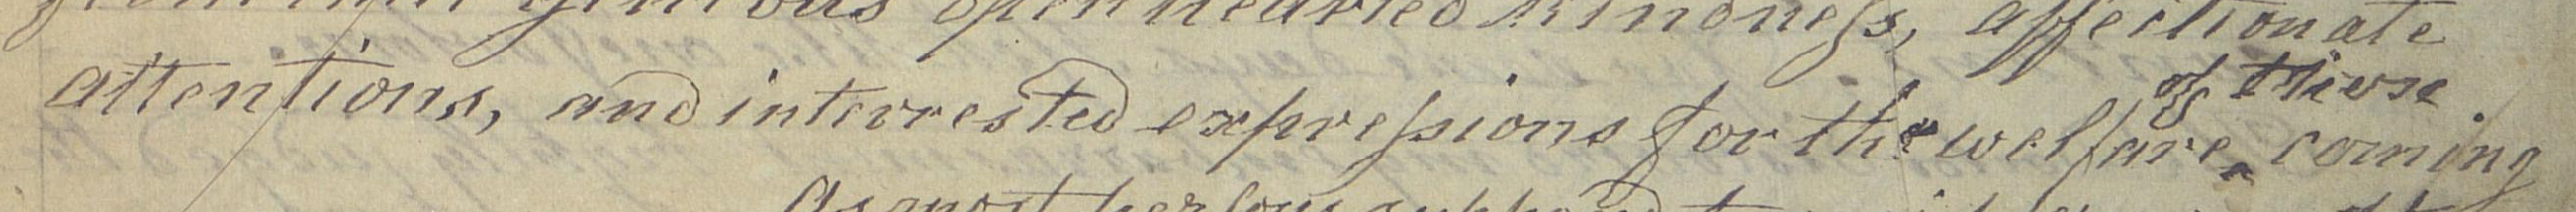attentions, and interested expressions for the welfare ^ coming
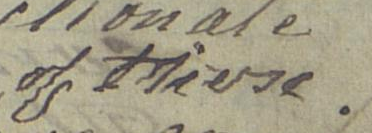of these
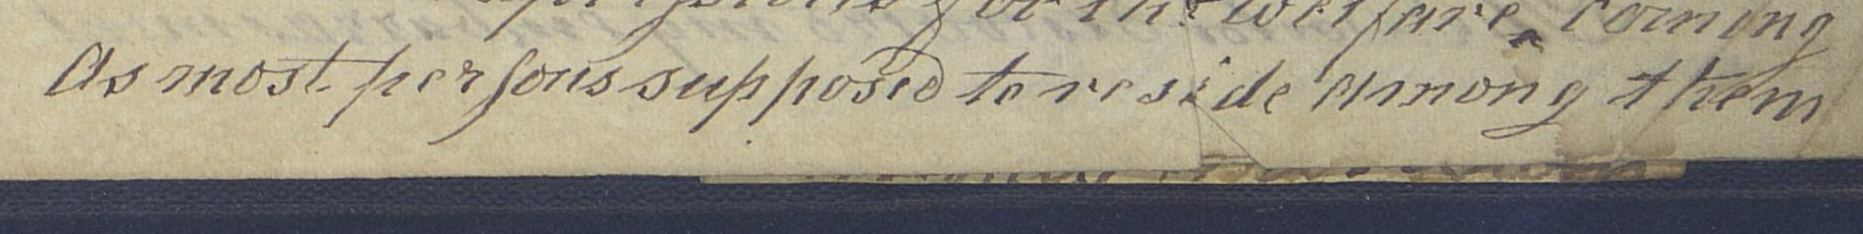As most persons supposed to reside among them
